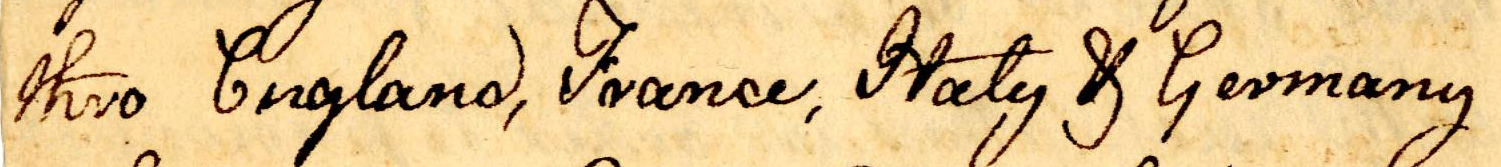thro England, France, Italy & Germany
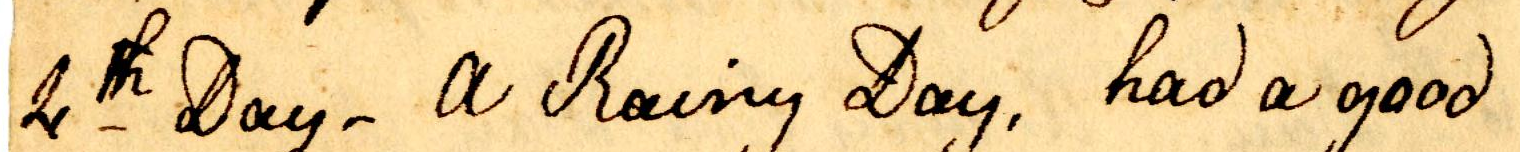4^th Day- A Rainy Day, had a good
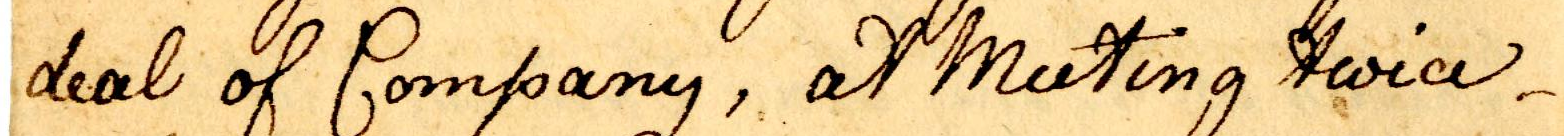deal of Company, at Meeting twice
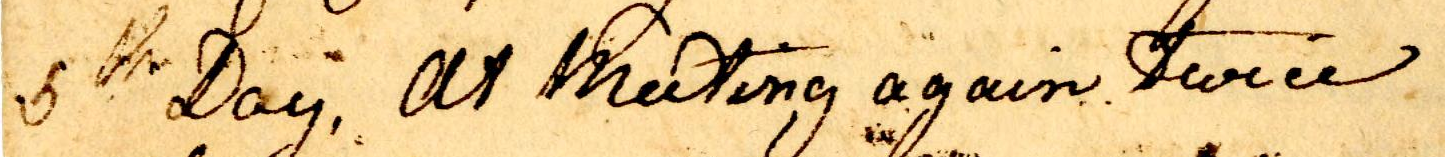5^th Day, At Meeting again twice
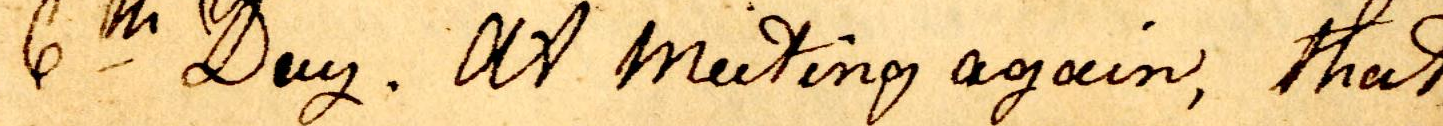6^th Day. At Meeting again, that
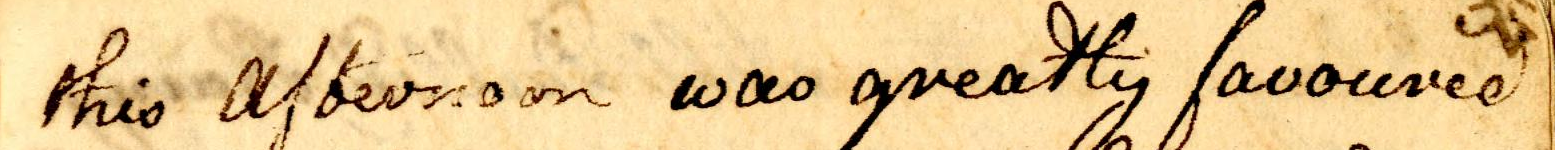this Afternoon was greatly favoured
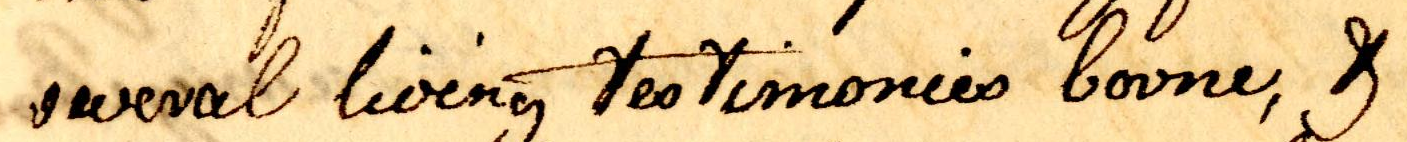several living testimonies borne, &
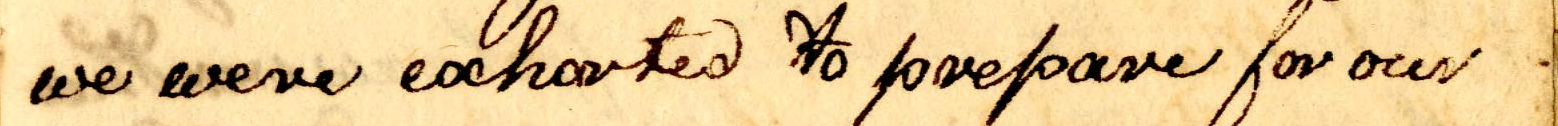we were exhauted to prepare for our
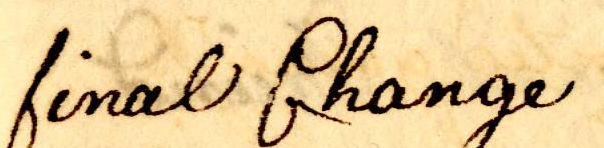final Change
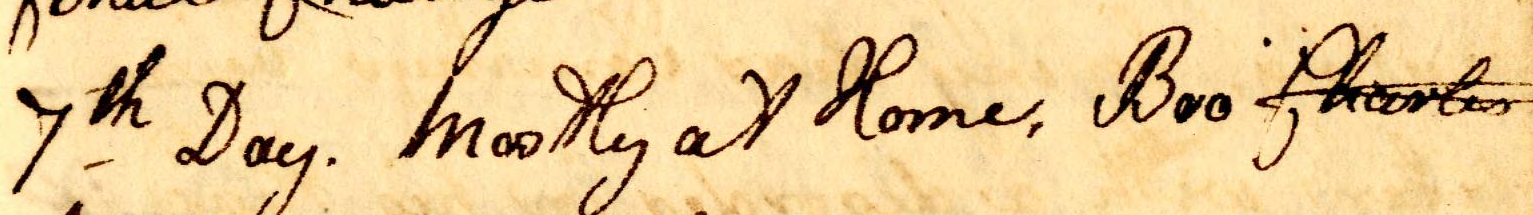7^th Day. Mostly at Home, Bro [Charles]
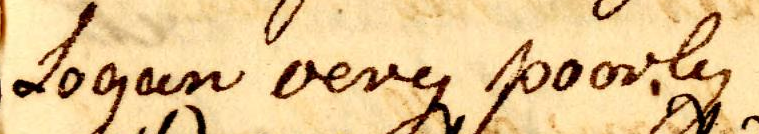Logan very poorly
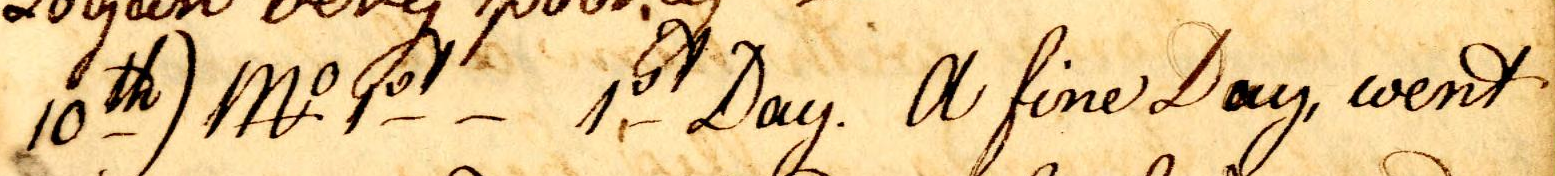10^th) M^o 1^st-- 1^st Day. A fine Day, went
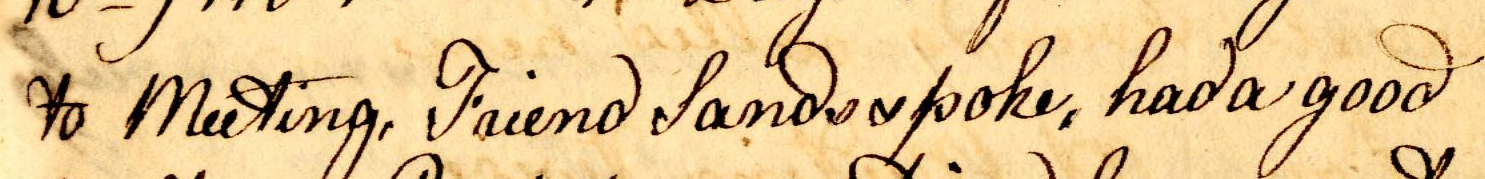to Meeting, Friend Sands spoke, had a good
